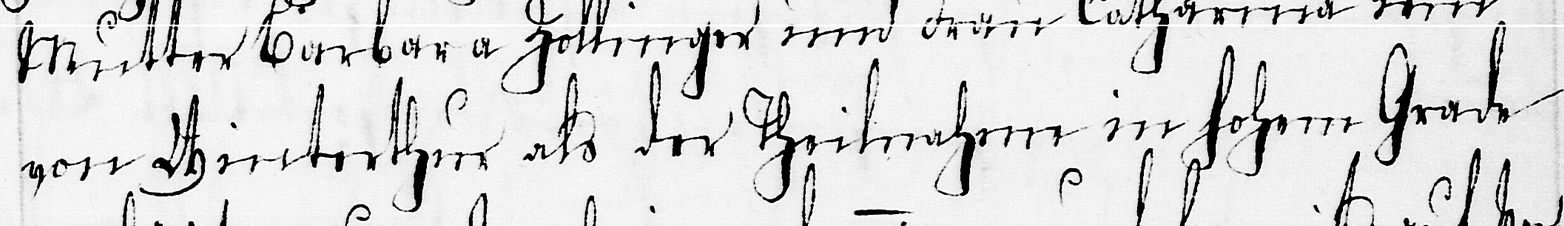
von Winterthur als der Theilnahme in hohem Grade
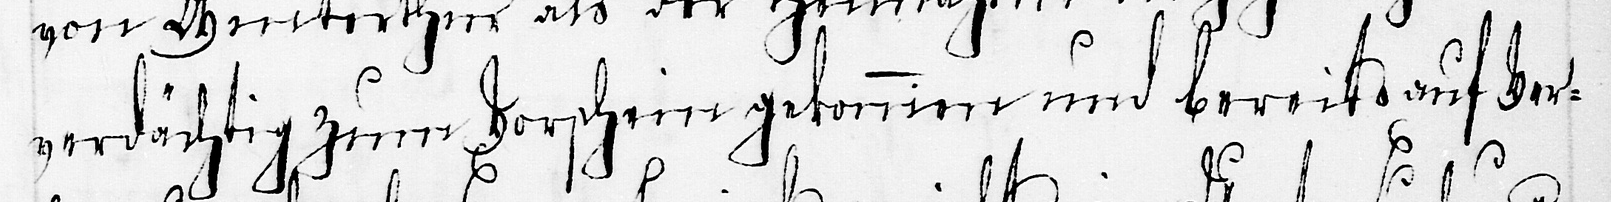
verdächtig zum Vorschein gekommen und bereits auf Ver¬
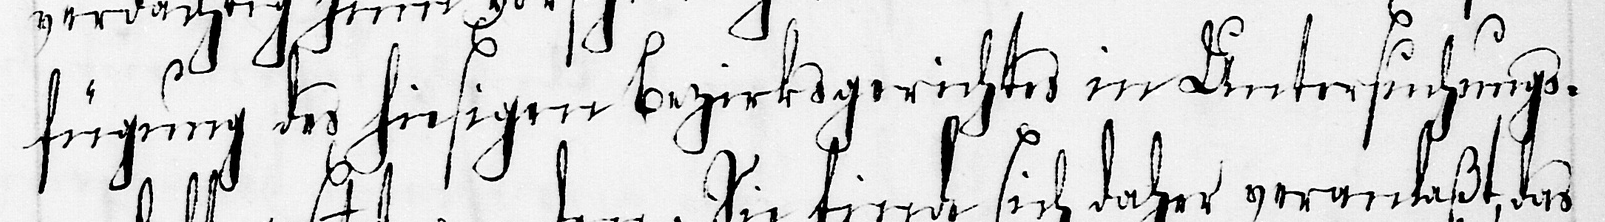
fügung des hiesigen Bezirksgerichtes in Untersuchungs¬
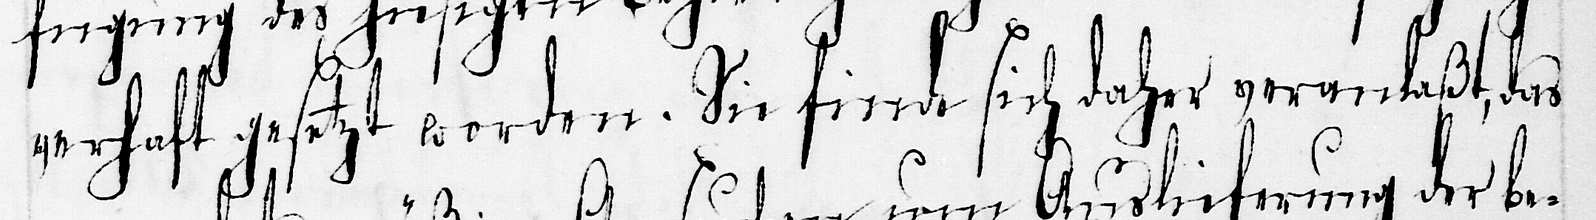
verhaft gesetzt worden. Sie finde sich daher veranlaßt, das
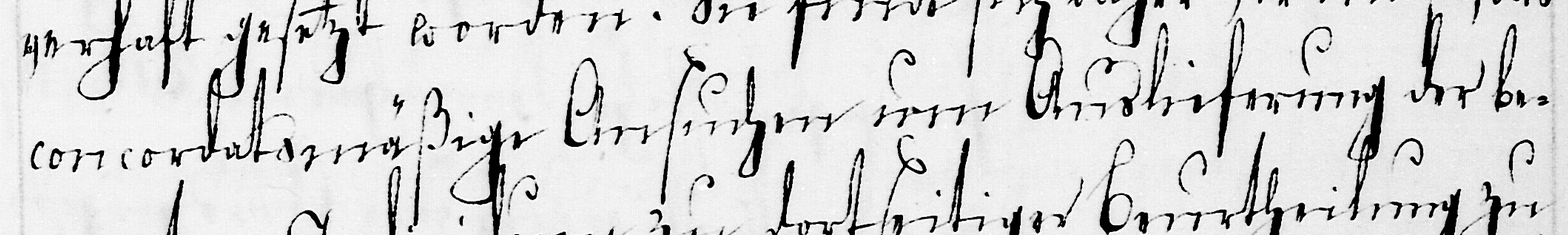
concordatsmäßige Ansuchen um Auslieferung der be¬
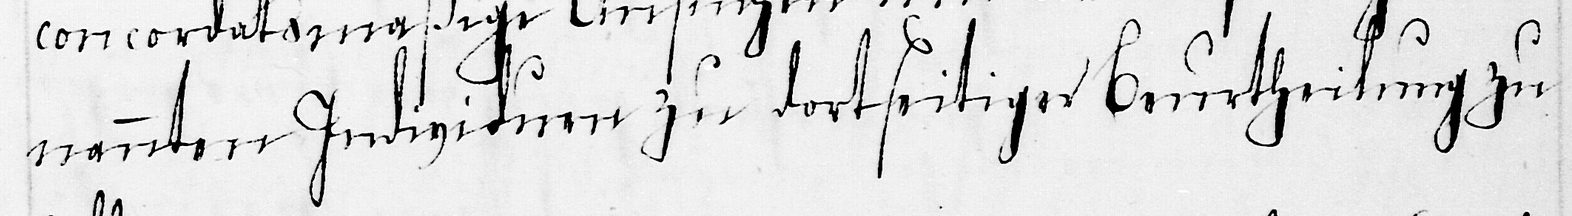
nannten Individuen zu dortseitiger Beurtheilung zu
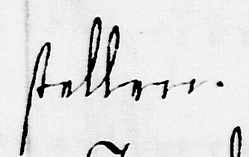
stellen.
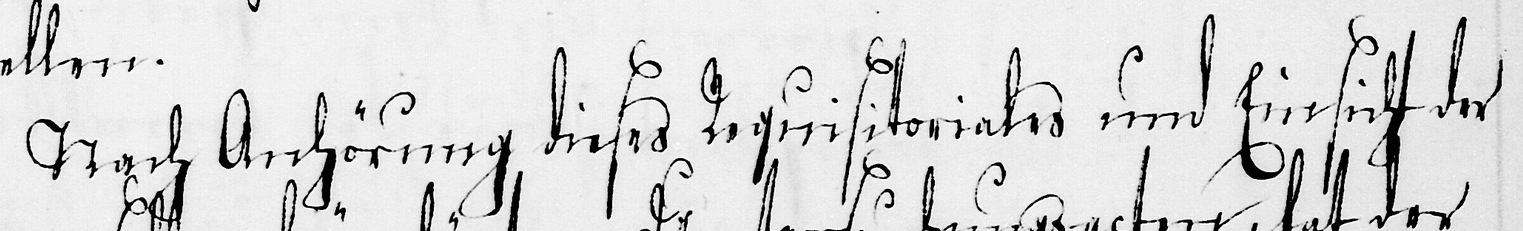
Nach Anhörung dieses Requisitoriales und Einsicht der
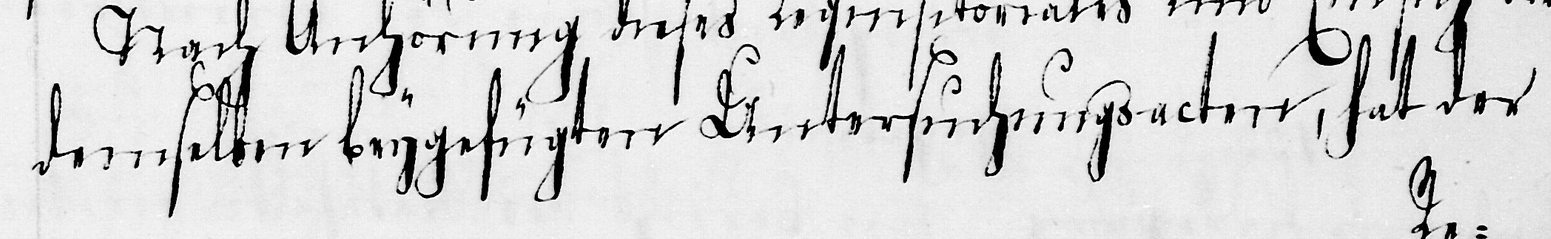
demselben beygefügten Untersuchungsacten, hat der
